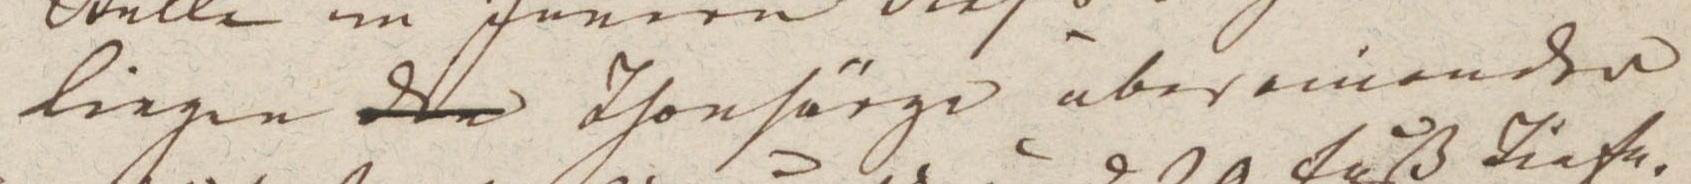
liegen die Thonsärge übereinander
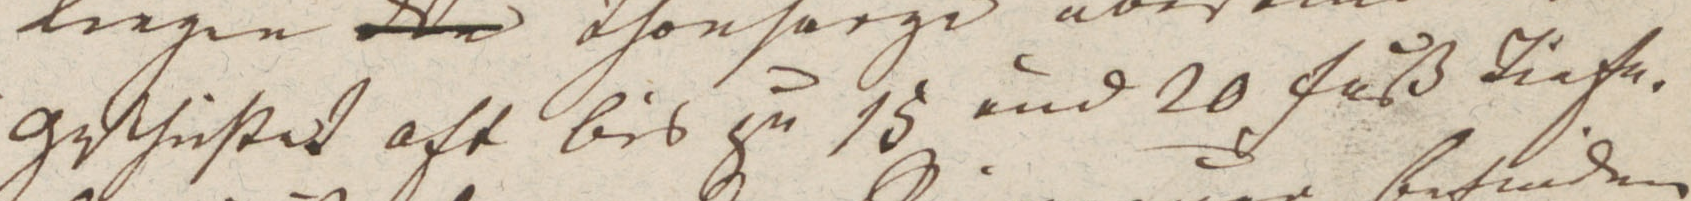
geschichtet oft bis zu 15 und 20 Fuss Tiefe.
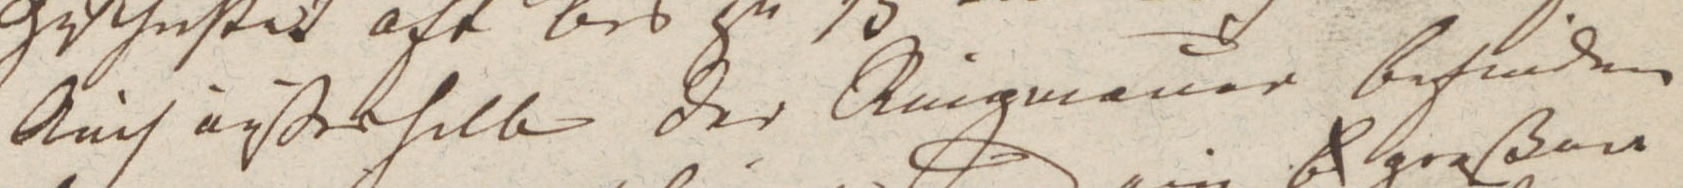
Auch ausserhalb der Ringmauer befinden
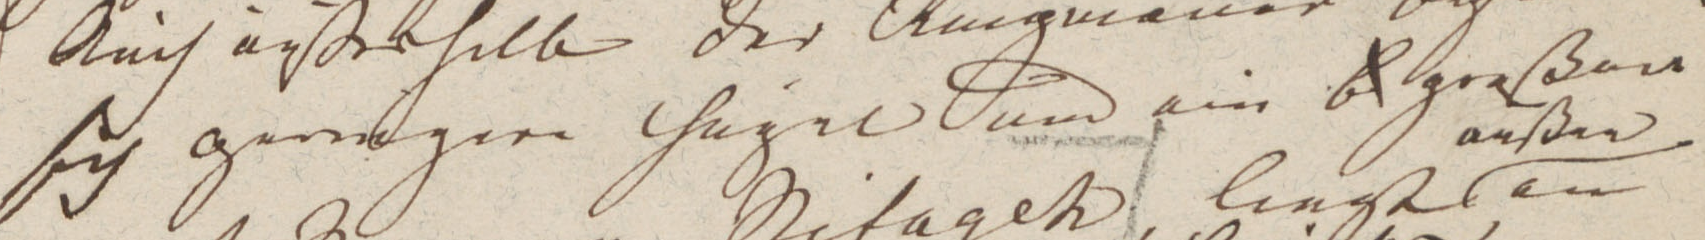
sich geringere Hügel und ein b grosser
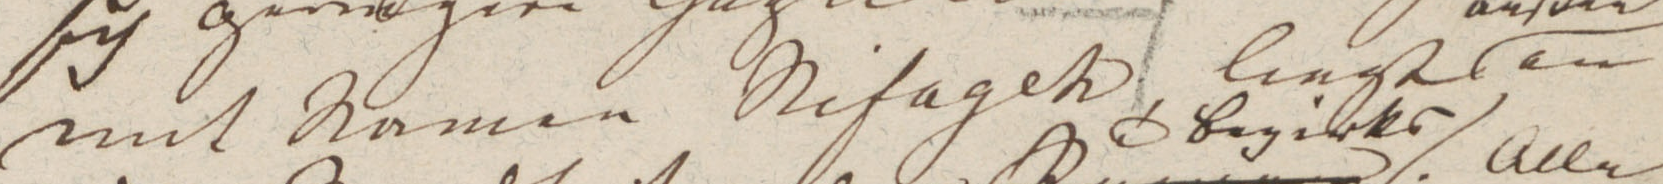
mit Namen Nifayeh% liegt aussen
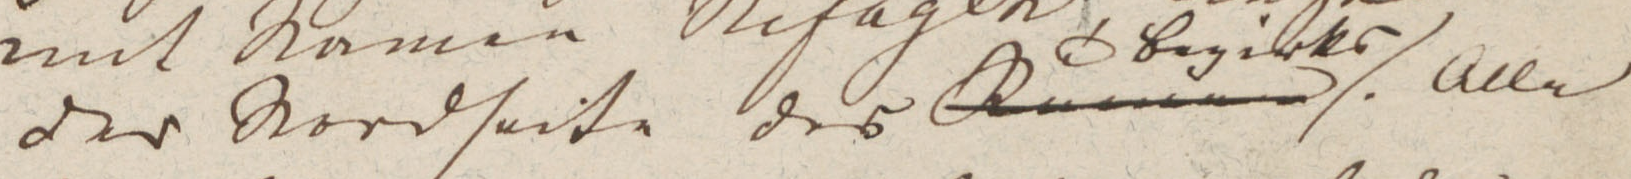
der Nordseite de Ruinen Bezirks. Alle
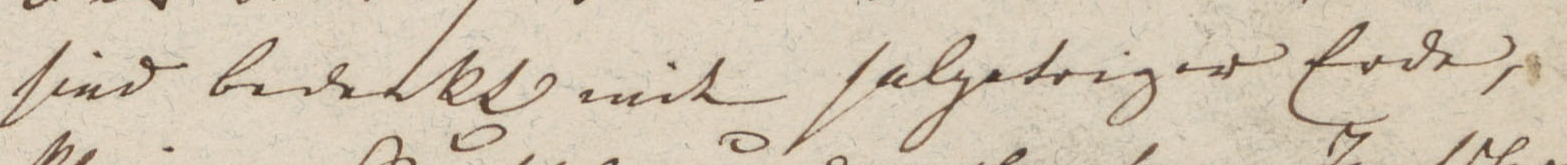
sind bedeckt mit salpetriger Erde,
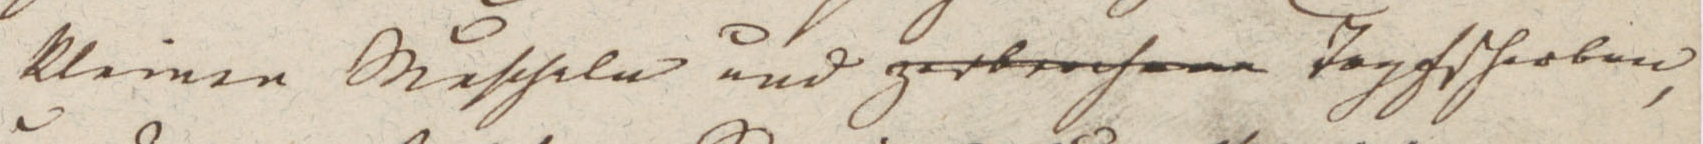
kleinen Muscheln und zerbrochene Topfscherben,
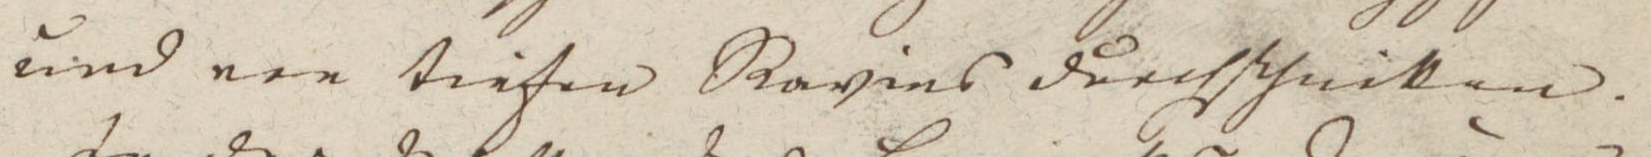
und von tiefen Ravins durchschnitten.
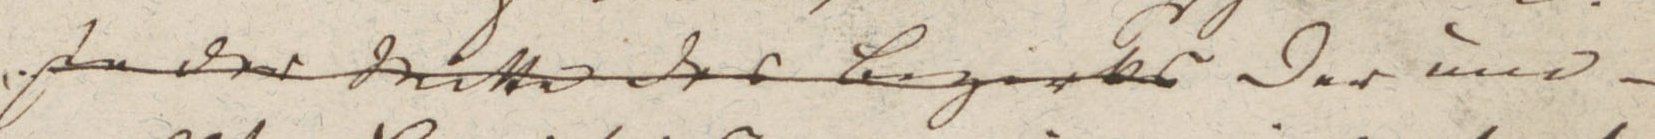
In der Mitte des Bezirks Der um-
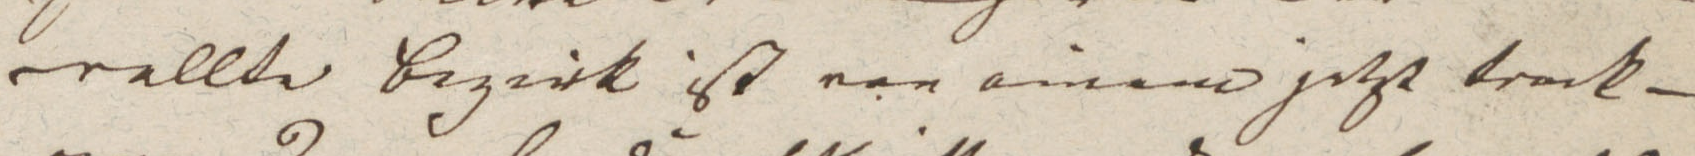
wallte Bezirk ist von einem jetzt trock-
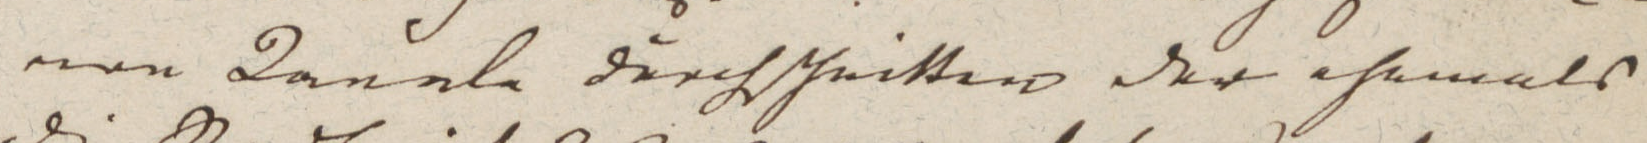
nen Kanale durchschnitten der ehemals
